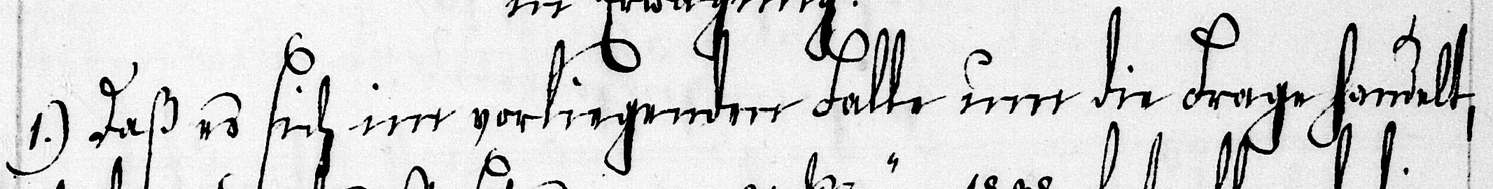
1.) Daß es sich im vorliegenden Falle um die Frage handelt,
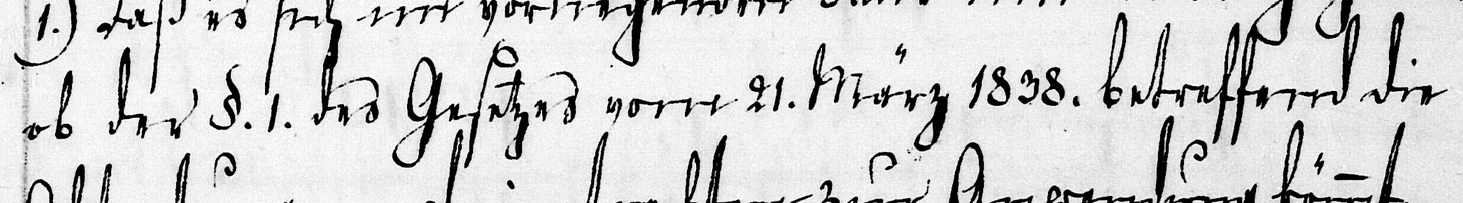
ob der §. 1. des Gesetzes vom 21. März 1838. betreffend die
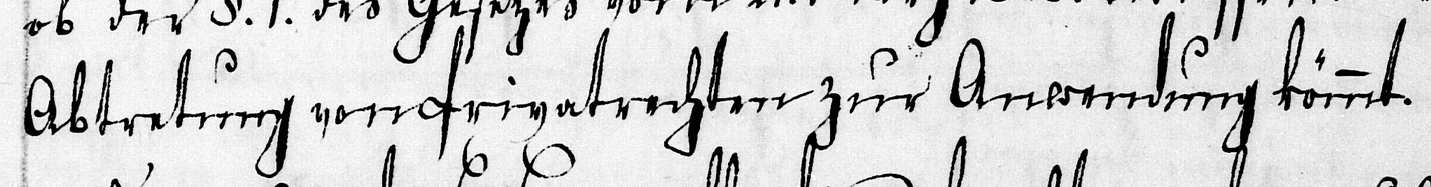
Abtretung von Privatrechten zur Anwendung kömmt.
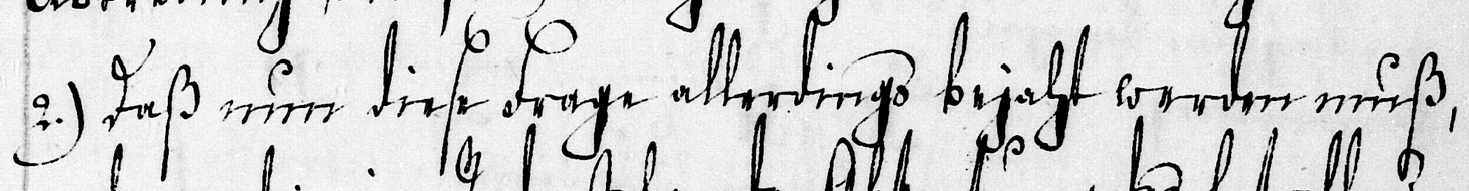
2.) Daß nun diese Frage allerdings bejaht werden muß,
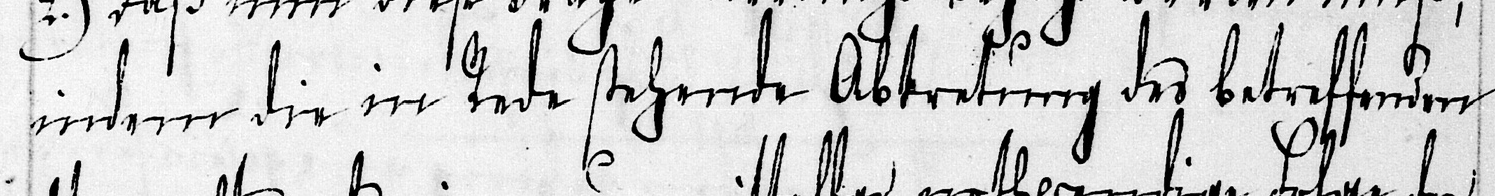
indem die in Rede stehende Abtretung des betreffenden
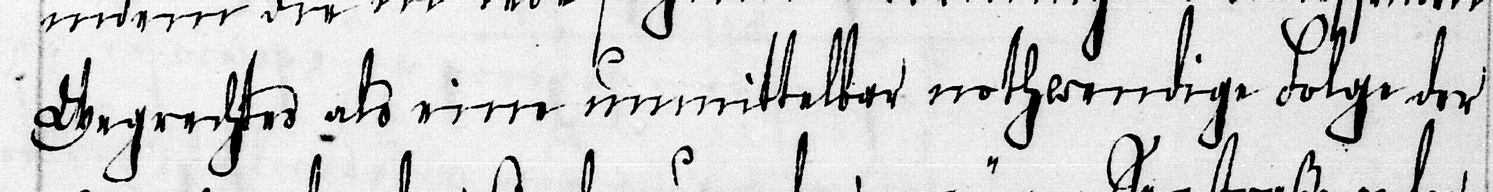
Wegrechtes als eine unmittelbar nothwendige Folge der
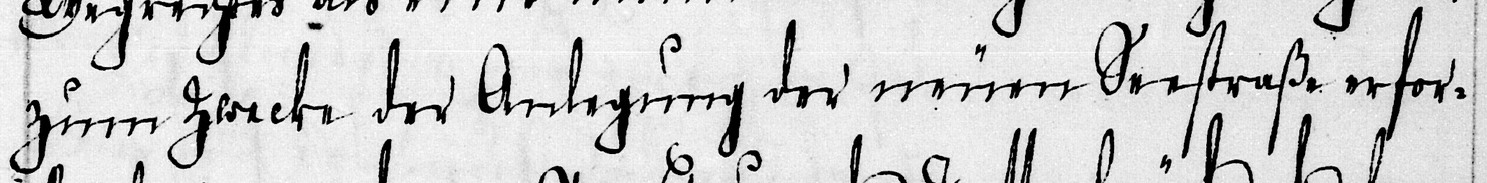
zum Zwecke der Anlegung der neuen Seestraße erfor¬
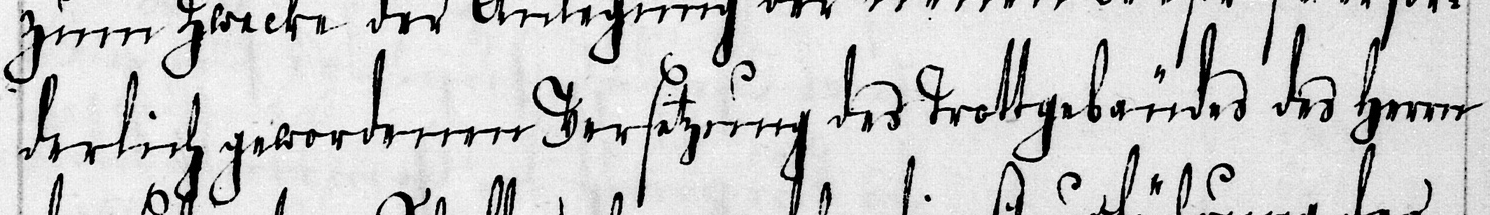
derlich gewordenen Versetzung des Trottgebäudes des Herrn
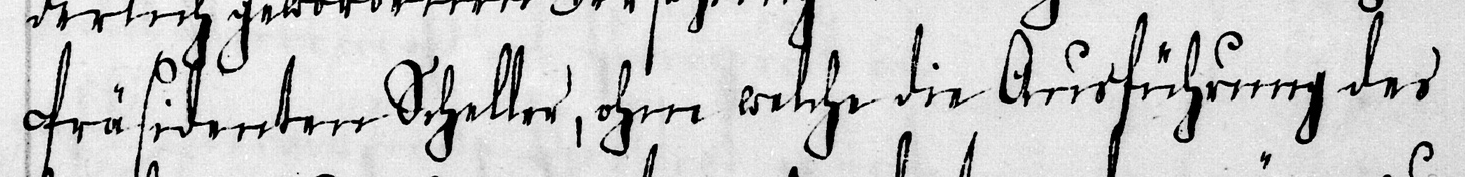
Präsidenten Scheller, ohne welche die Ausführung des
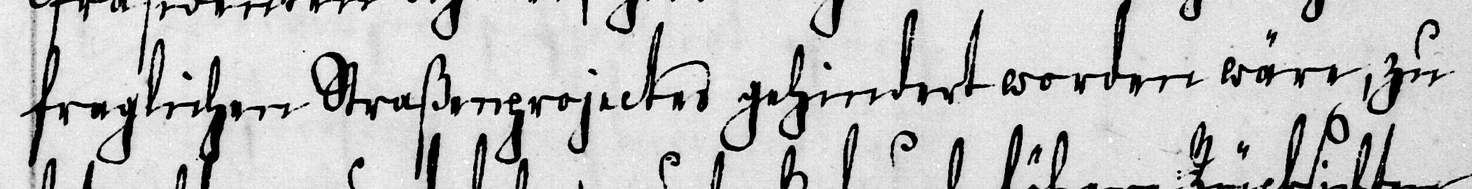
fraglichen Straßenprojectes gehindert worden wäre, zu
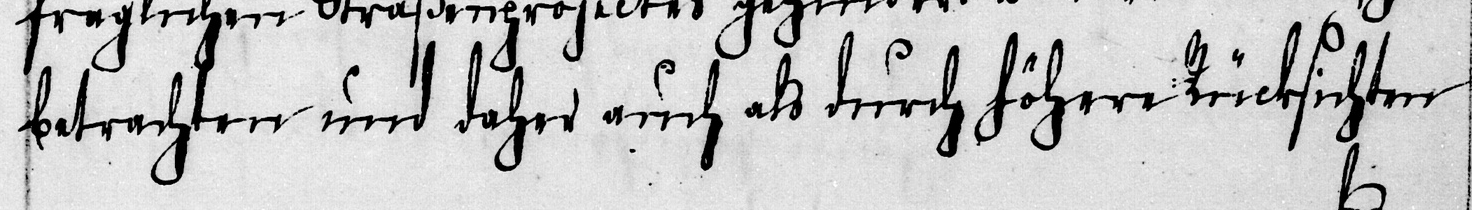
betrachten und daher auch als durch höhere Rücksichten
